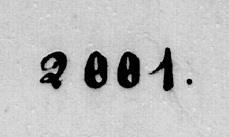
2001.
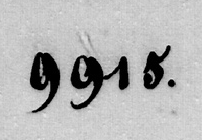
9915.
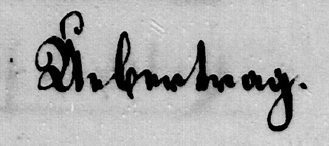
Uebertrag:
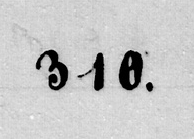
310.
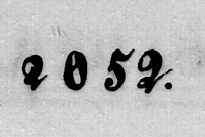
2052.
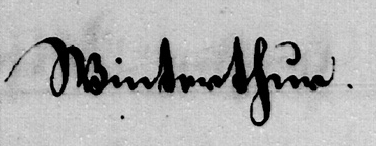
Winterthur
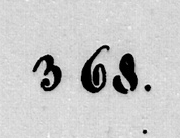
368.
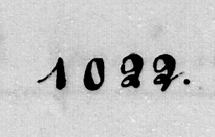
1022.
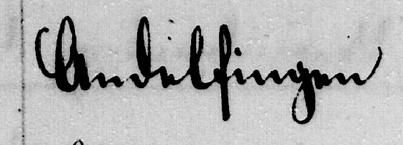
Andelfingen
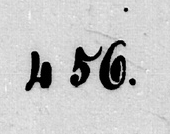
456.
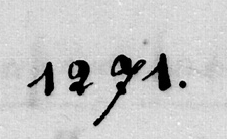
1271.
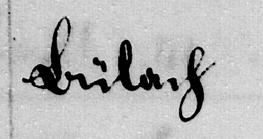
Bülach
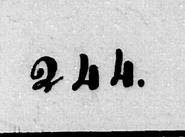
244.
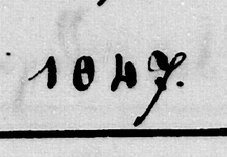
1047.
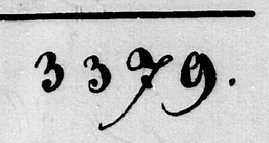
3379.
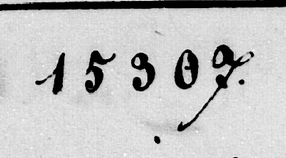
15307.
